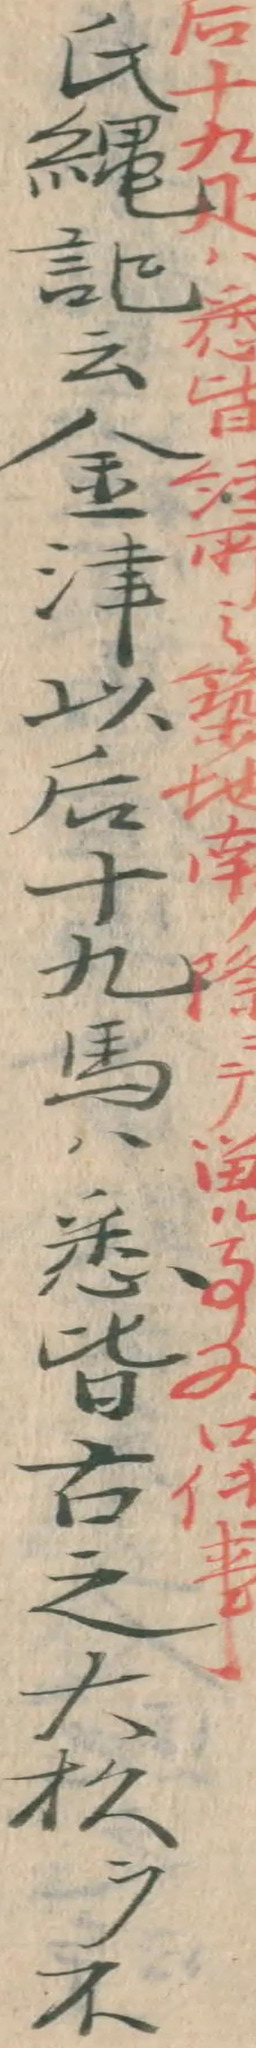氏縄記云金津以后十九馬ハ悉皆古之大杉ヲ不
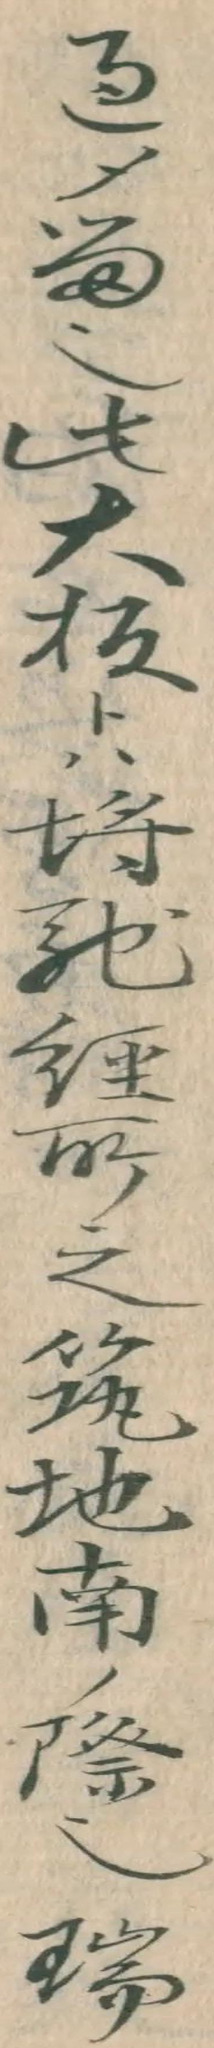過シテ留也此大杉トハ埒馳経所之築地南ノ際也瑞
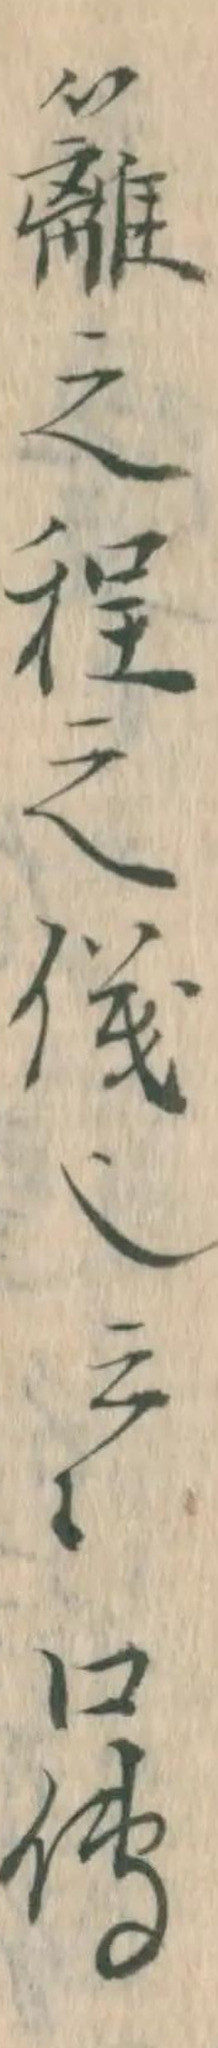籬之程之儀也云々口伝
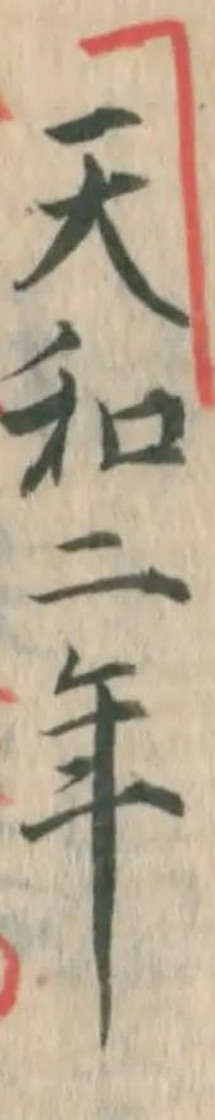天和二年

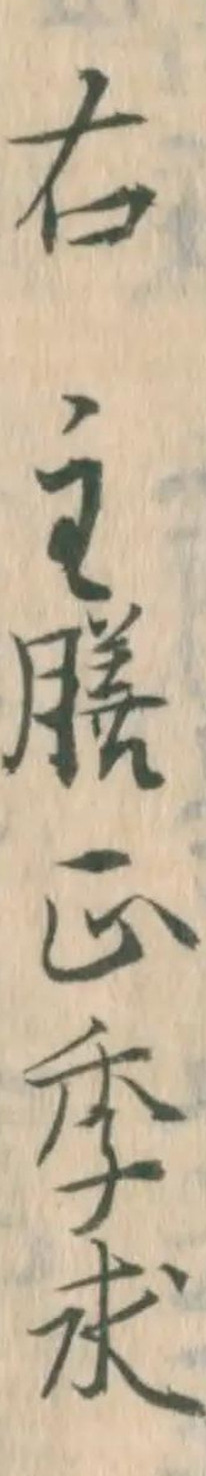右主膳正季求
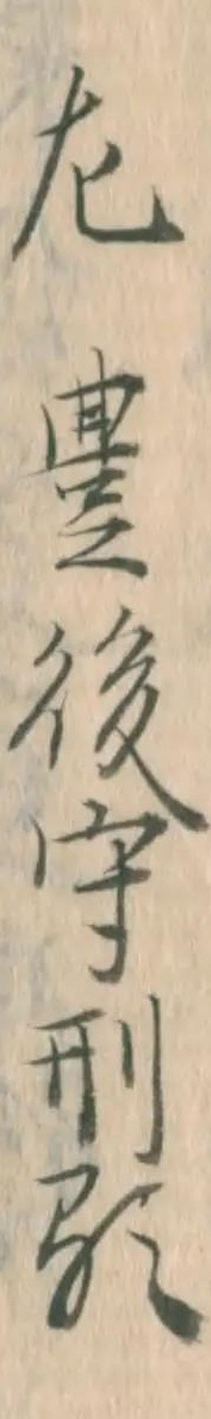左豊後守刑顕
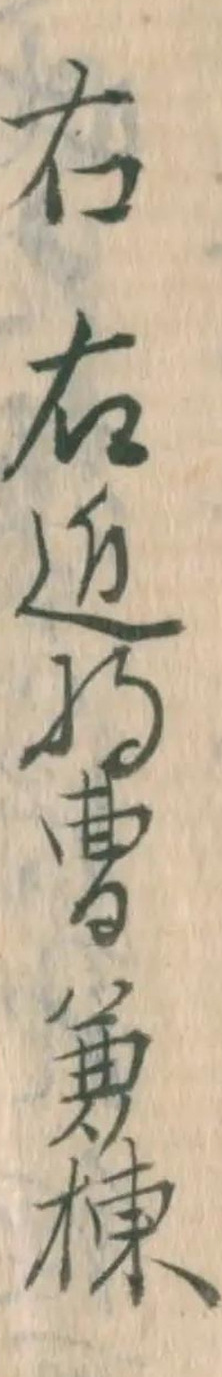右右近将曹兼棟
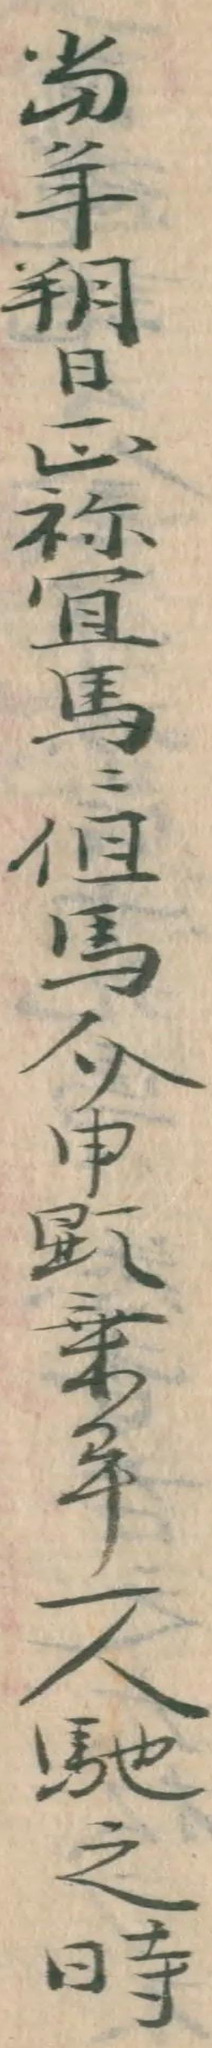当年朔日正祢宜馬ニ但馬介申顕乗畢一人馳之時
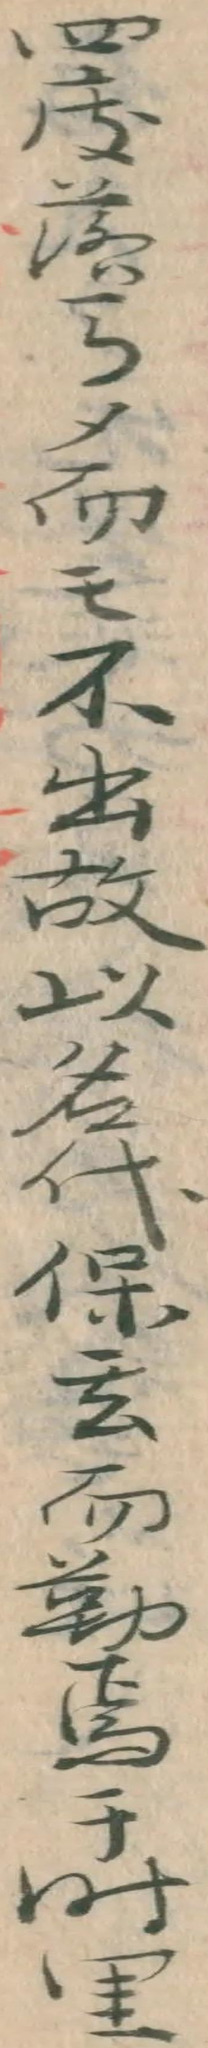四度落馬シテ而モ不出故以名代保玄而勤焉于時里
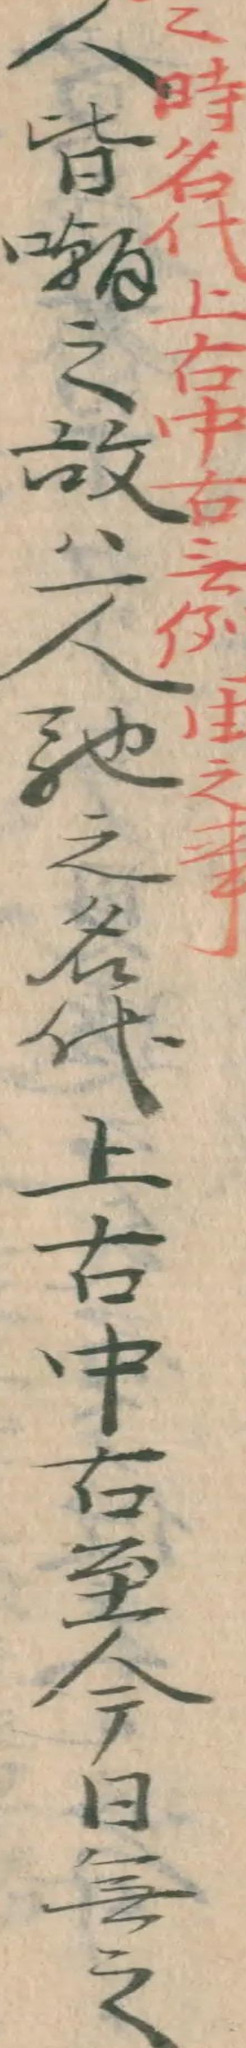人皆嘲之故ハ一人馳之名代上古中古至今日無之
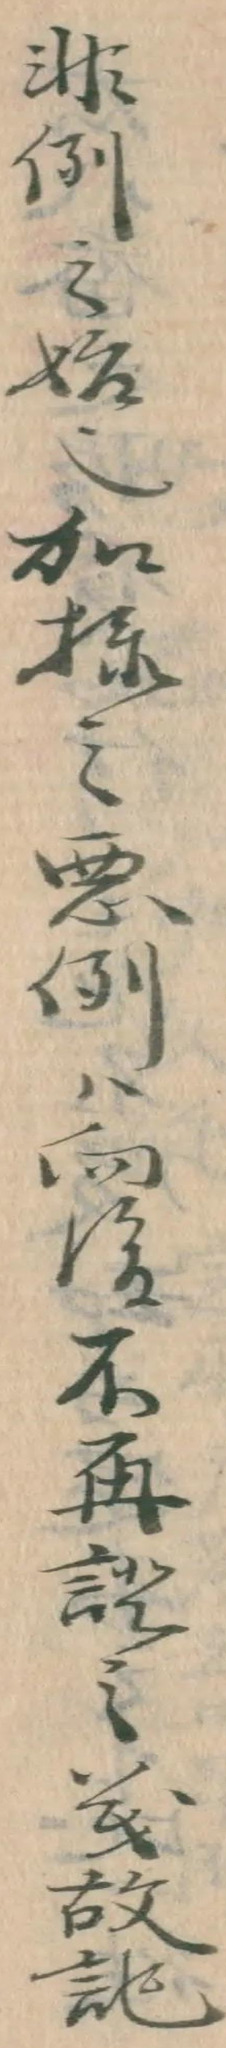非例之始也加様之悪例ハ向後不再証之義故記
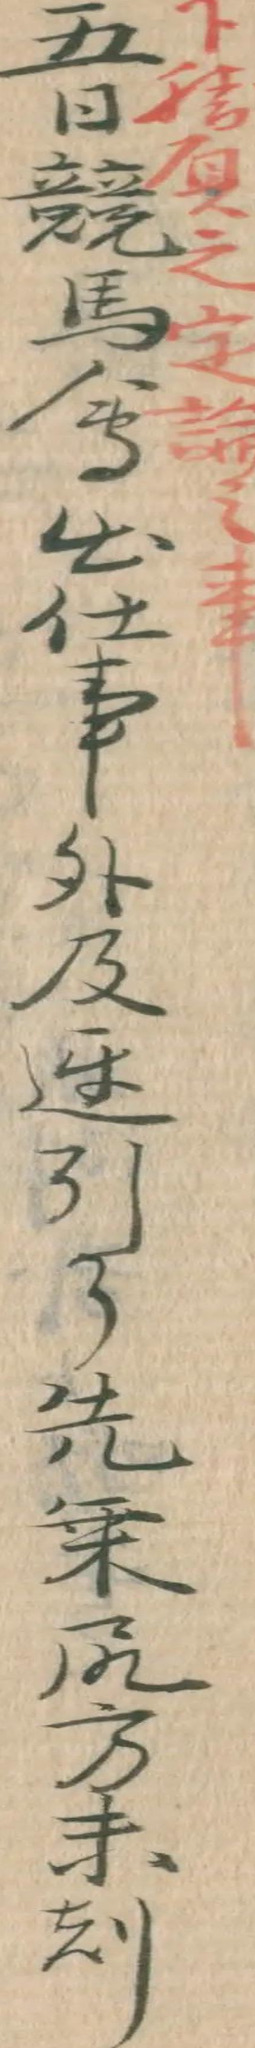五日競馬会出仕事外及遅引了先乗尻方未刻
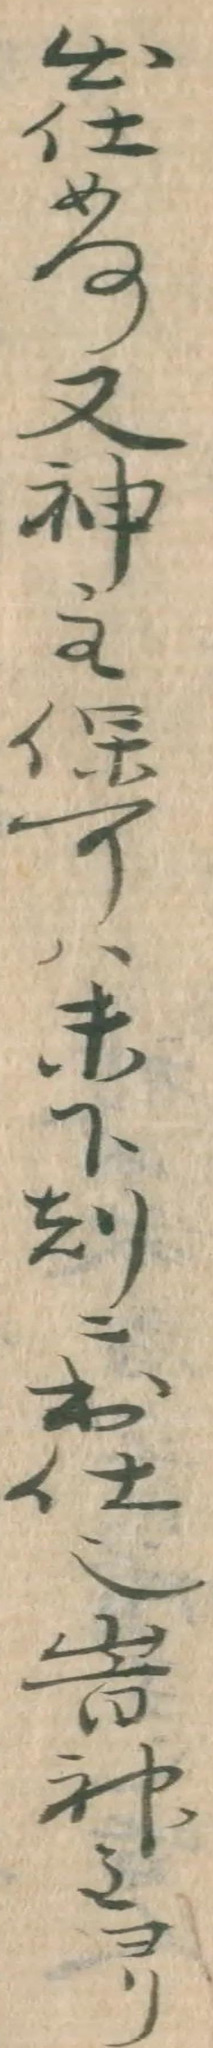出仕如何又神主保可ハ未下刻ニ出仕也旹神主ヨリ
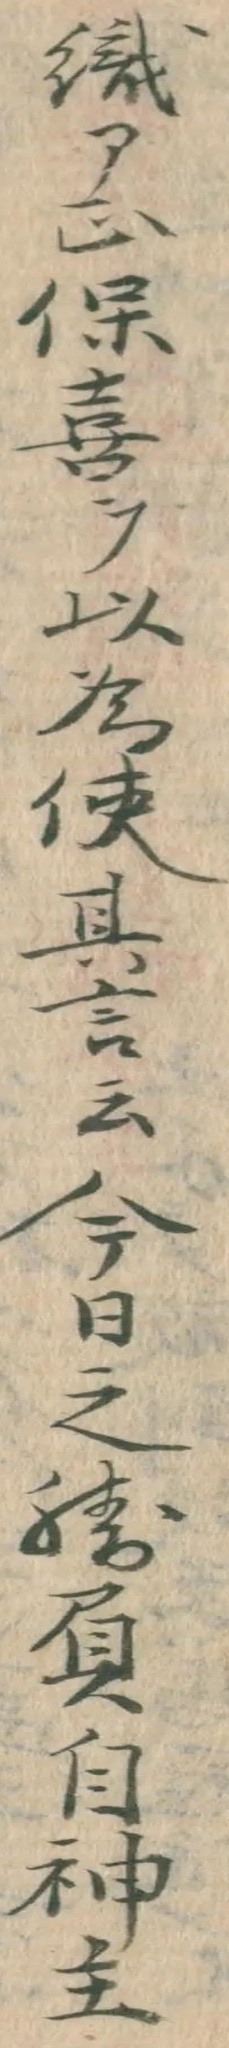織部正保喜ヲ以為使其言云今日之勝負自神主
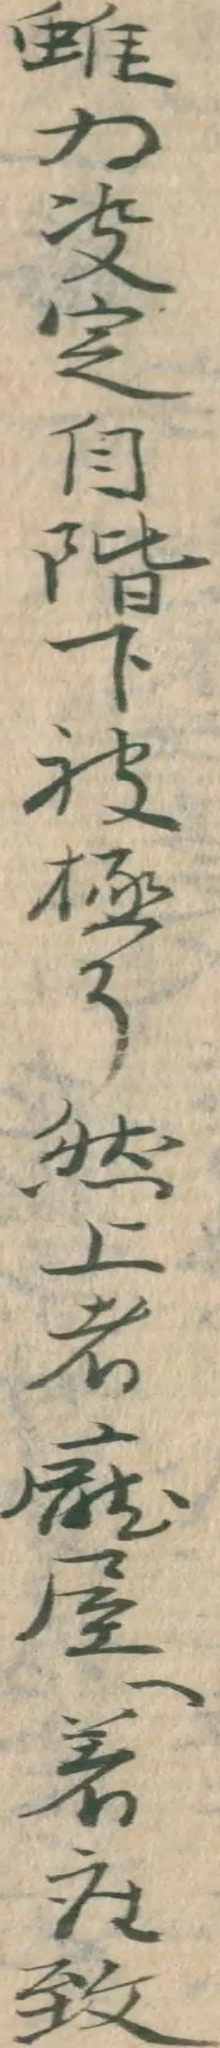雖為決定自階下被極了然上者庁屋へ着座致
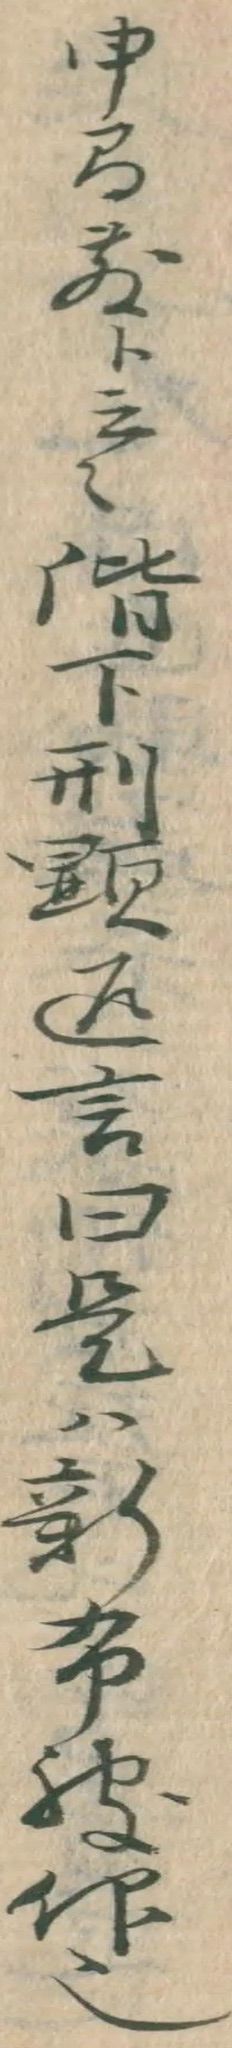申間敷ト云々階下刑顕返言曰是ハ新布被仰也
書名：賀茂社記録. 第10冊
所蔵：国立国会図書館 National Diet Library, JAPAN
